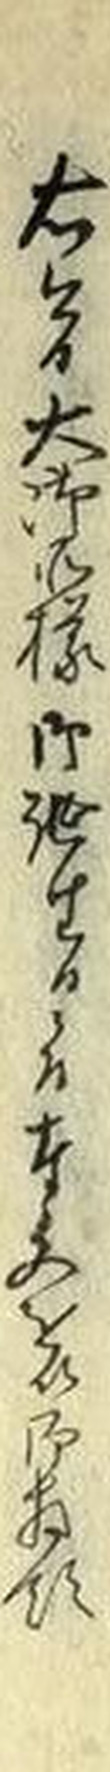右今日大御所様御誕生日ニ付奉文を以御拝領
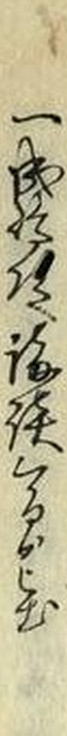一成嶋殿講談今日ゟ被出
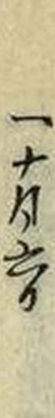一十月七日
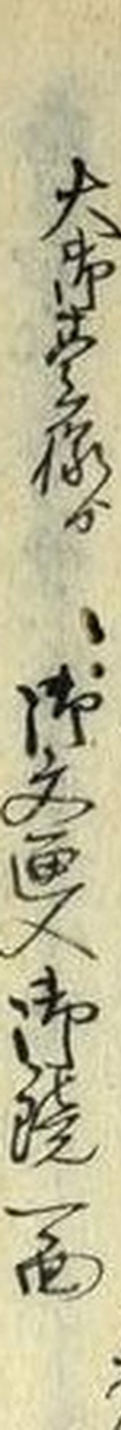大御台様ゟ御文匣入御鏡一面
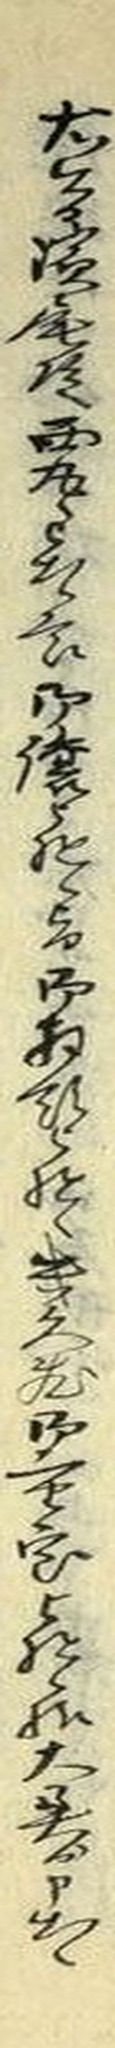右今日浜尾殿西丸へ被出候節御譲被遊候旨御拝領被遊候幾久敷御重宝被遊候様大奥ゟ申出候
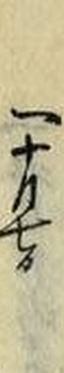一十月七日
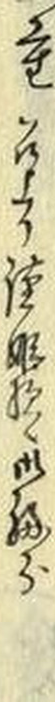召上り謹姫様へ御福分
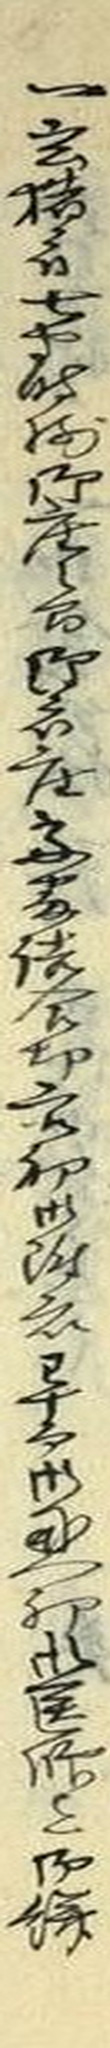一玄猪ニ付七半時揃御座之間御着座当番詰合切最初御附衆畢而御用人初御医師迄御餅
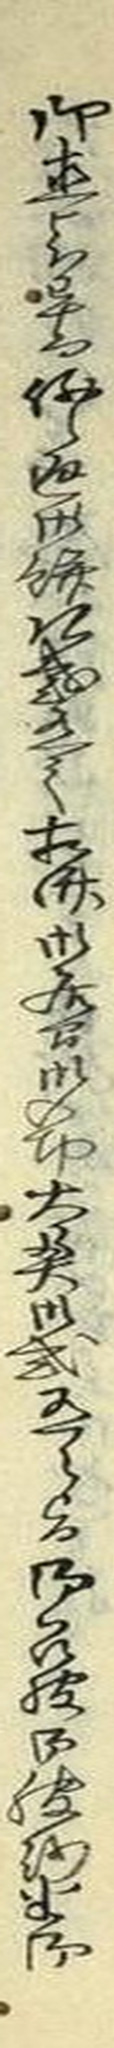御直被下畢而例之通御餅頂戴有之相済御居間御〆切大奥御式有之候旨御召服御服紗半御
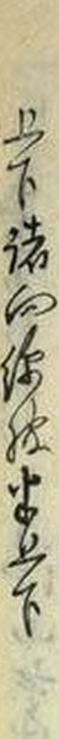上下諸向紋服半上下
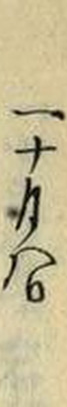一十月七日
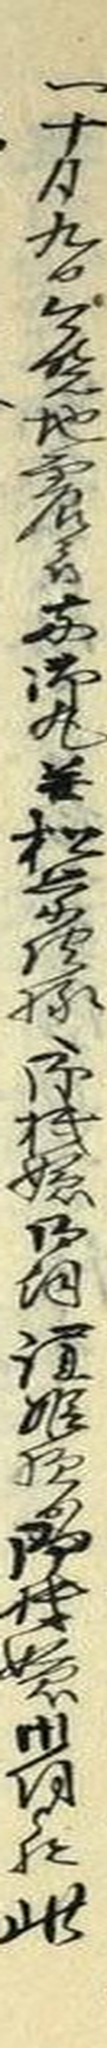一十月九日今晩地震ニ付両御丸幷松栄院様へ御機嫌御伺謹姫様ゟ御機嫌御伺被遊此
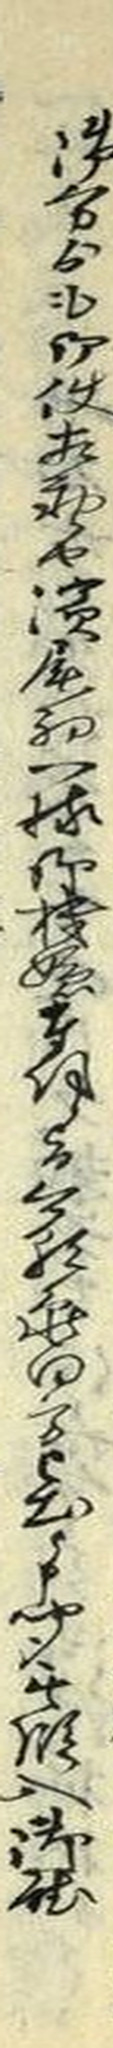御方ゟも御使相勤候由浜尾初一縁御機嫌奉伺候旨今朝亀田方被出被申聞其段入御聴
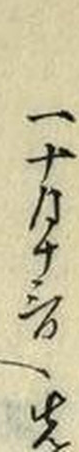一十月十五日
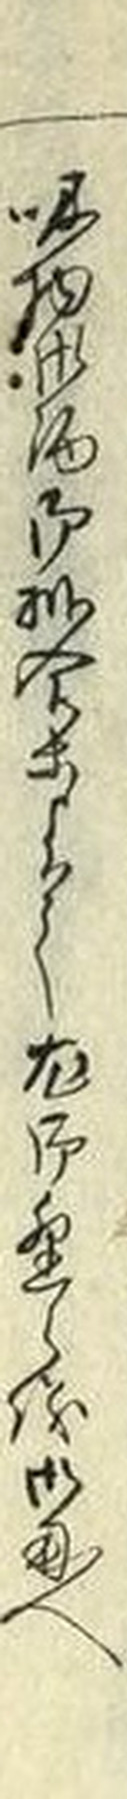吸物御酒御掛合等被下之尤御逢之儀御用人
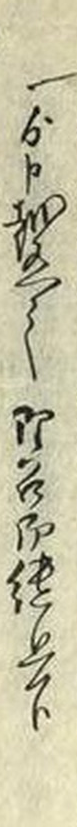ゟ申越有之御召御継上下
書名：少傅日録抄（斉善付側向頭取日記、在府）
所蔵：福井県文書館 Fukui Prefectural Archives
